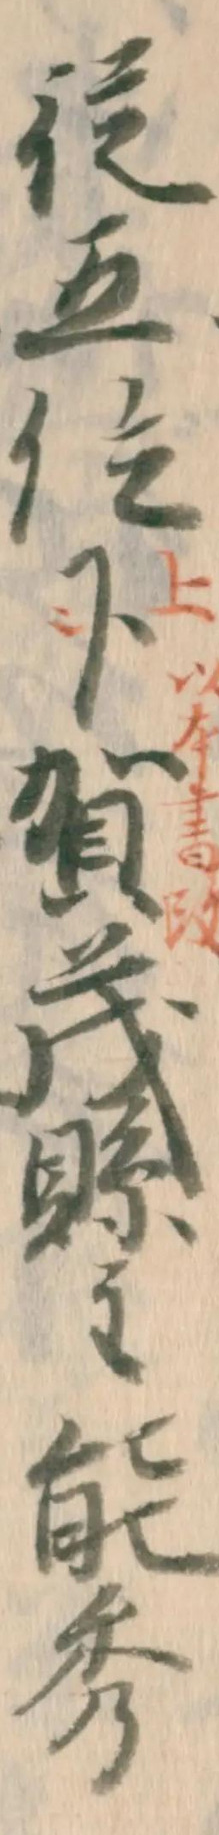正五位下賀茂県主能季
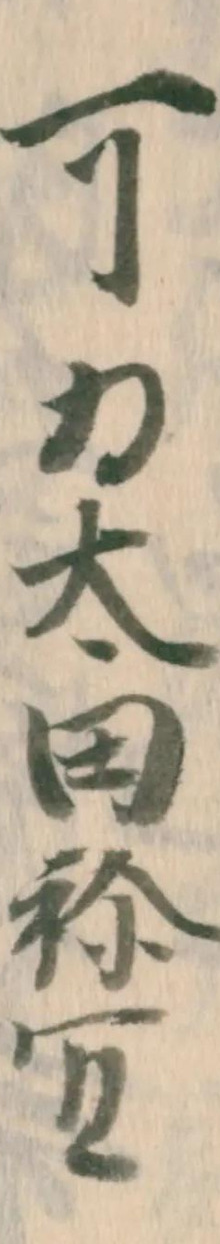可為太田祢宜
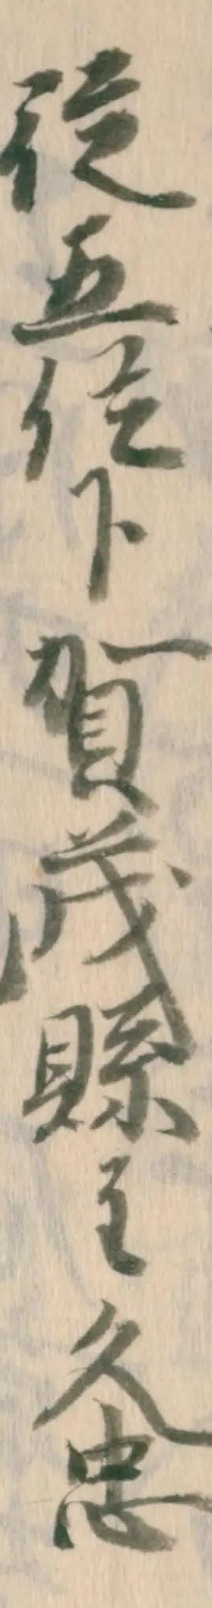従五位下賀茂県主久忠
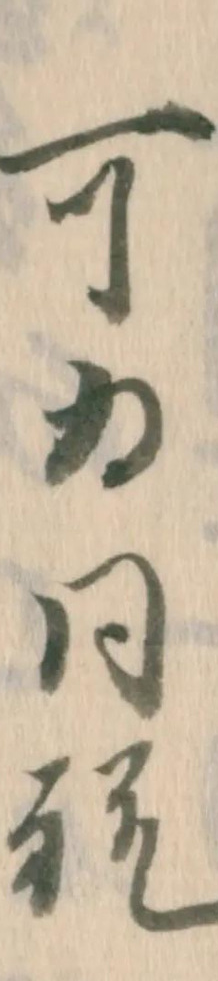可為同祝
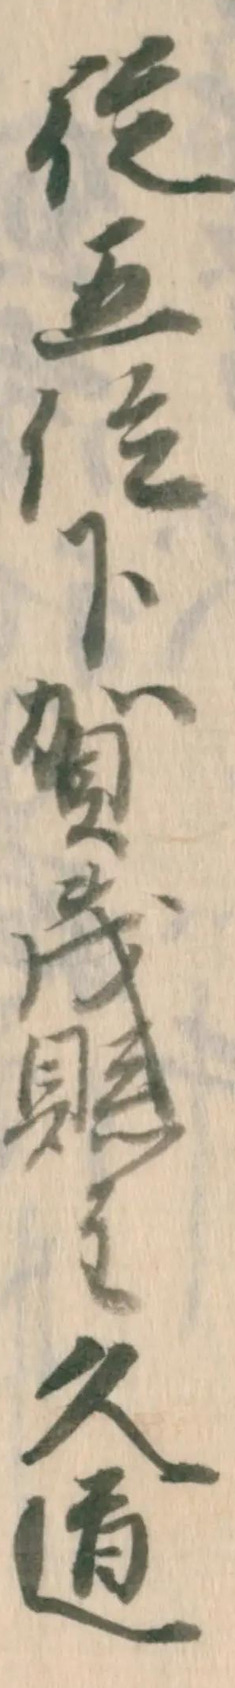従五位下賀茂県主久道
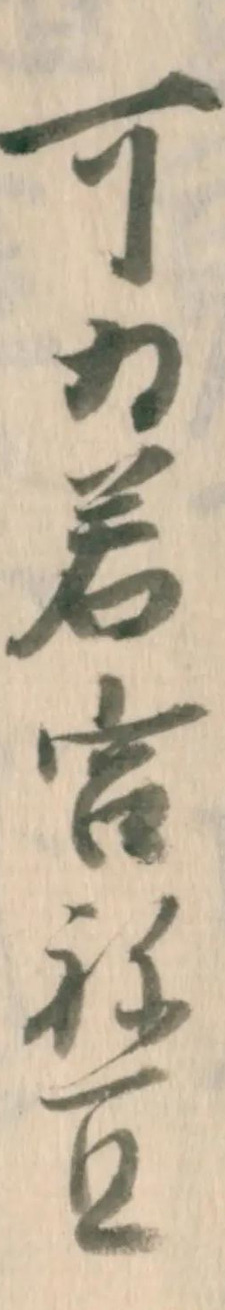可為若宮祢宜
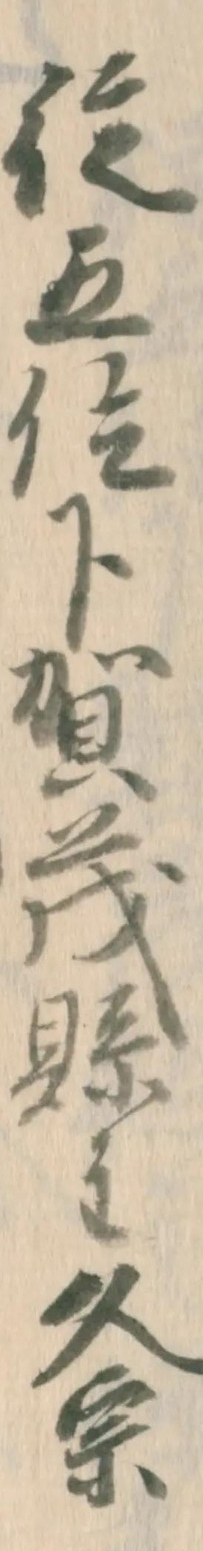従五位下賀茂県主久忠
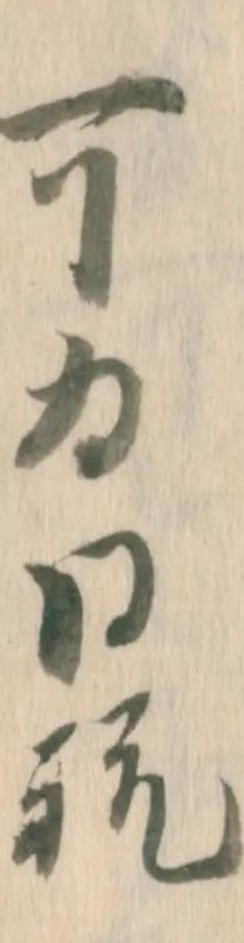可為同祝
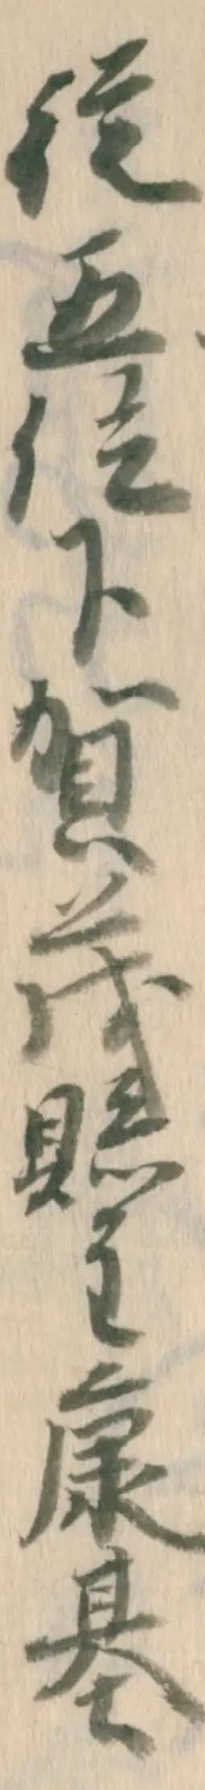従五位下賀茂県主康基

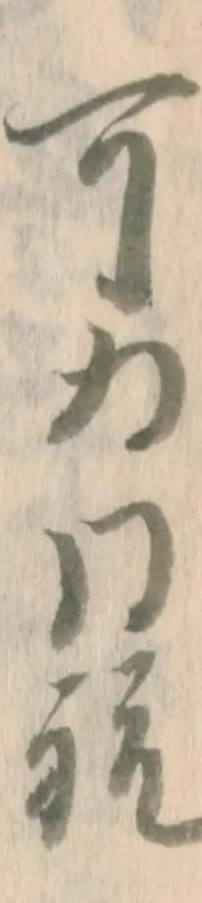可為同祝
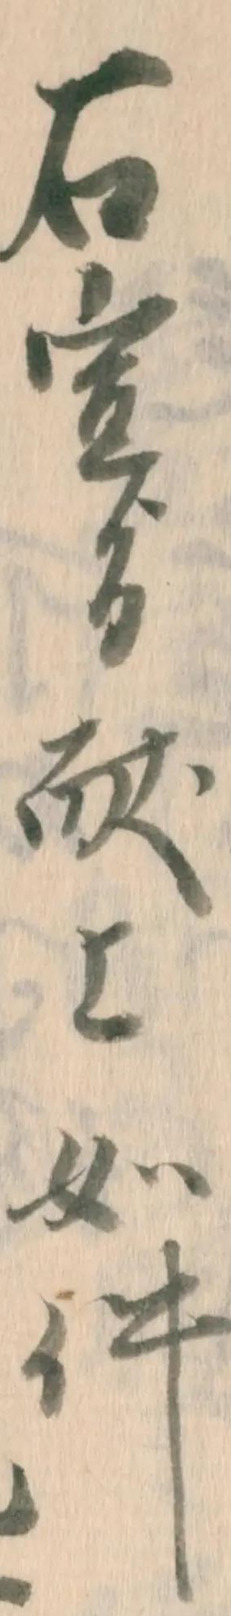右宣旨献上如件
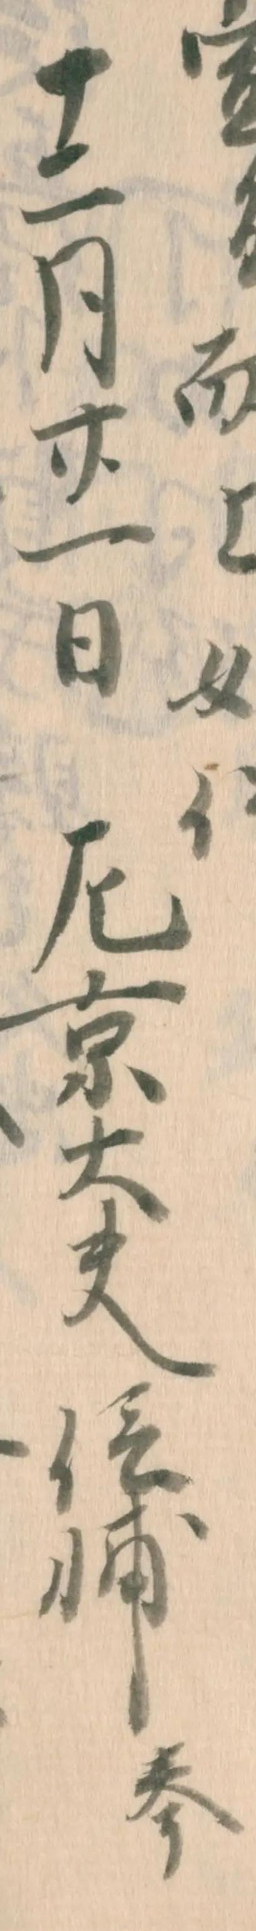十二月廿一日左京大夫信輔奉
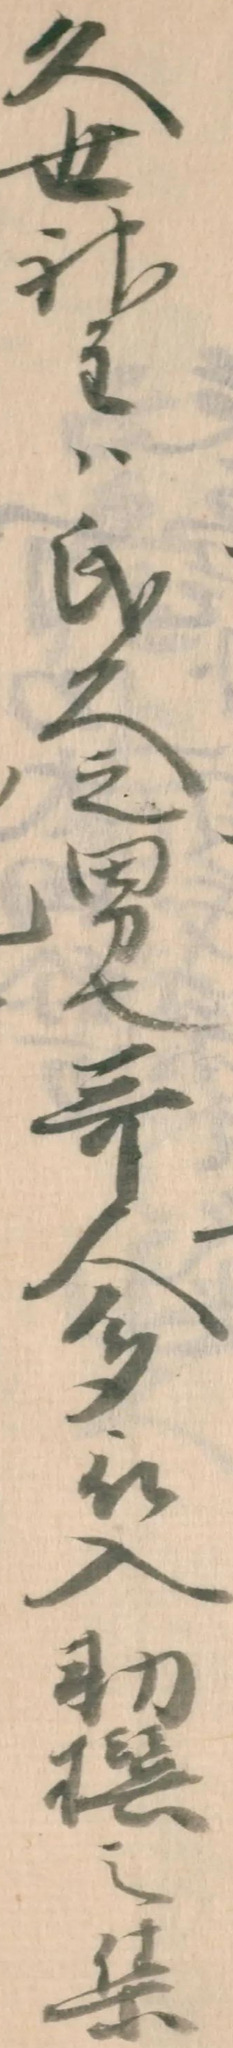久世神主は氏久之男也哥人多被入勅撰之集
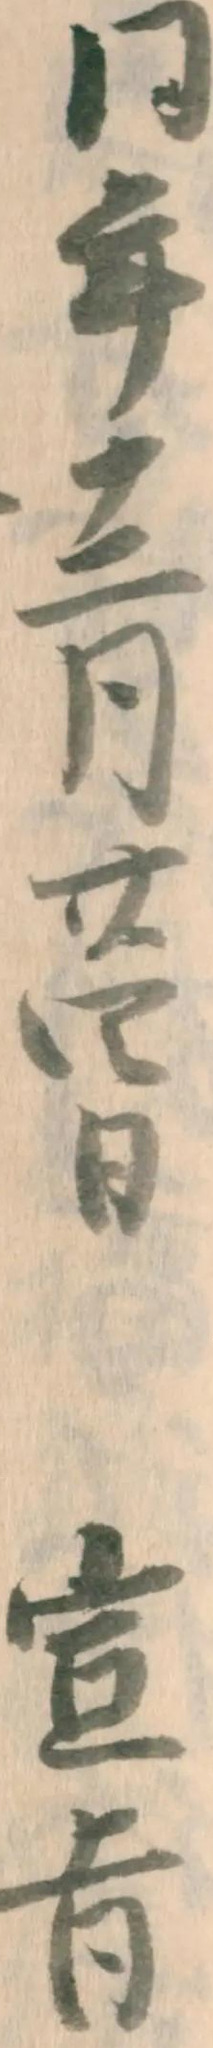同年十二月廿四日宣旨
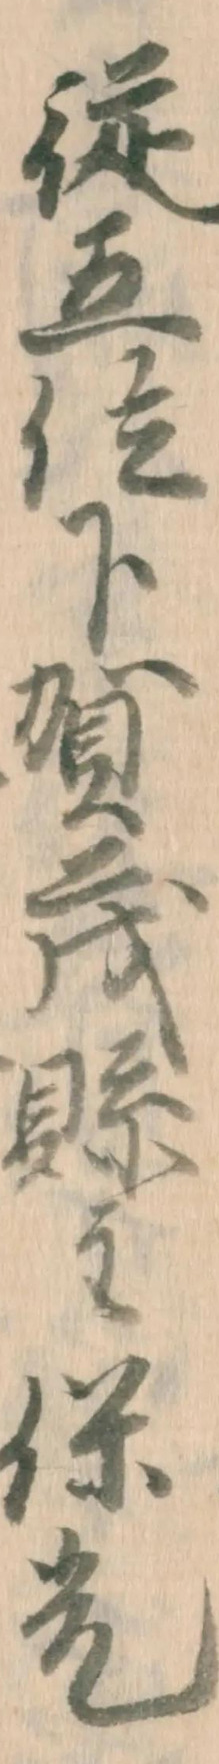従五位下賀茂県主保光
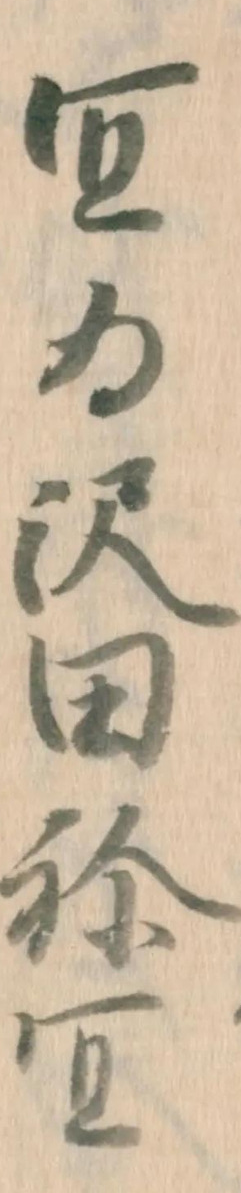宜為沢田祢宜
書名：賀茂社記録. 第1冊
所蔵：国立国会図書館 National Diet Library, JAPAN
